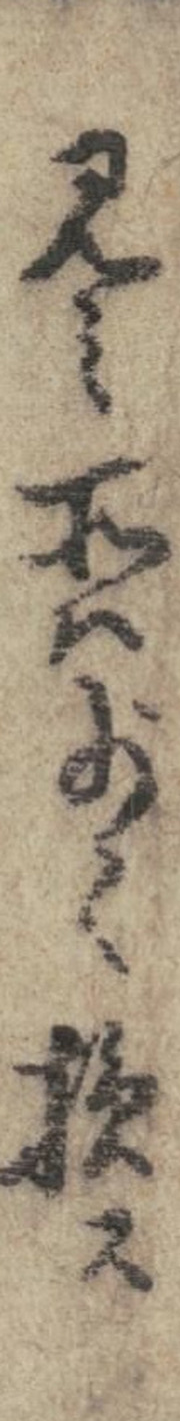見之所は少〻損ス
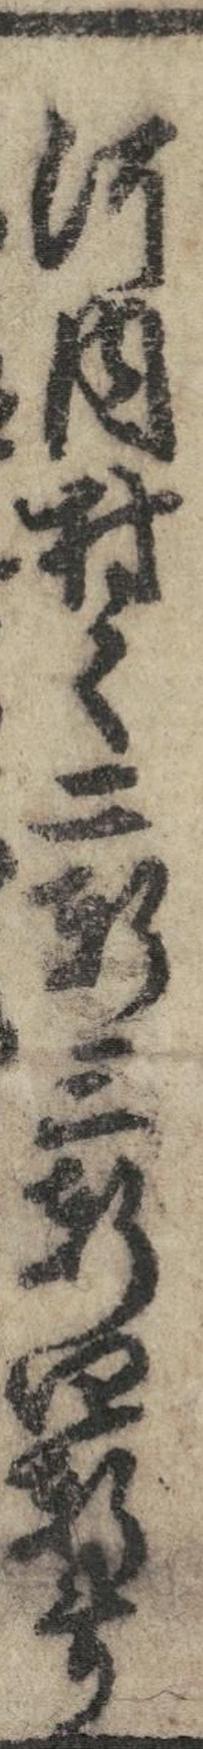河内村〻二軒三軒四軒計り
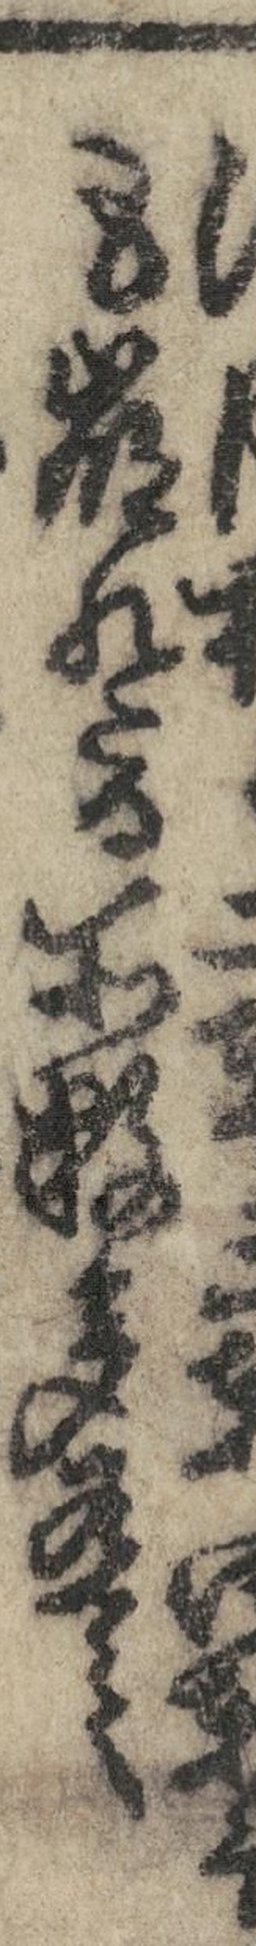も崩れたる所数多有之
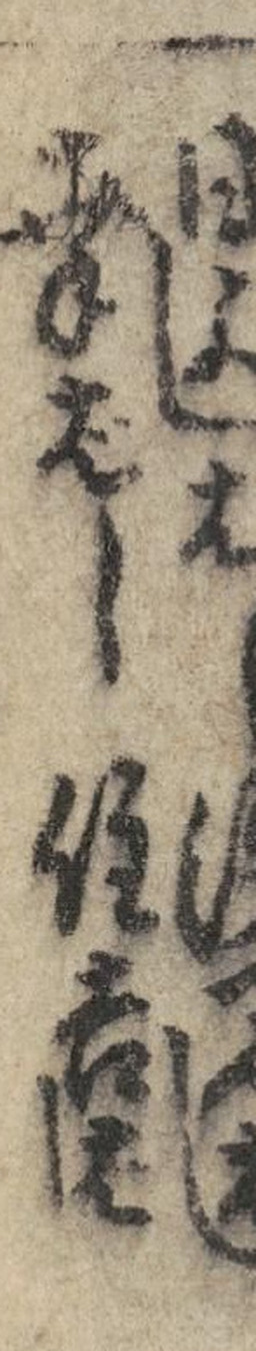幸ばし住吉ばし
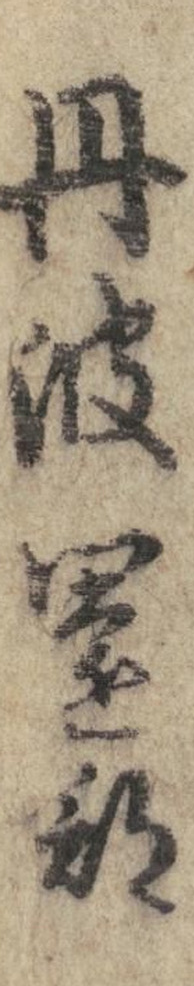丹羽園部
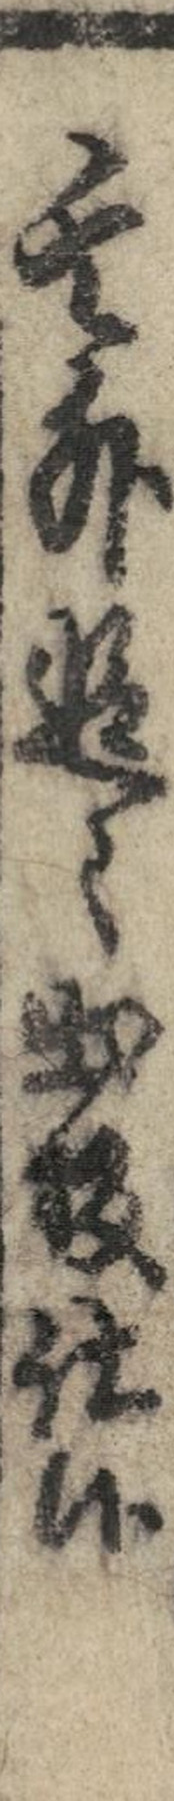其外追〻出抜仕候
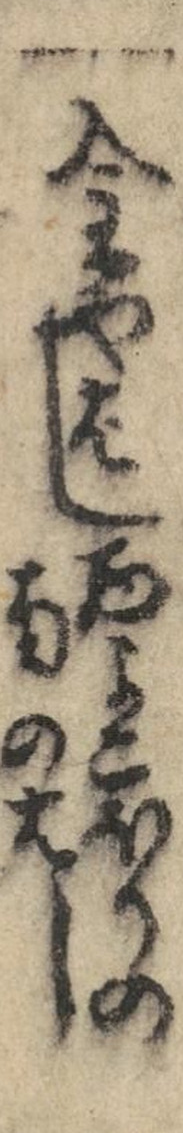金やばし西よこほりの
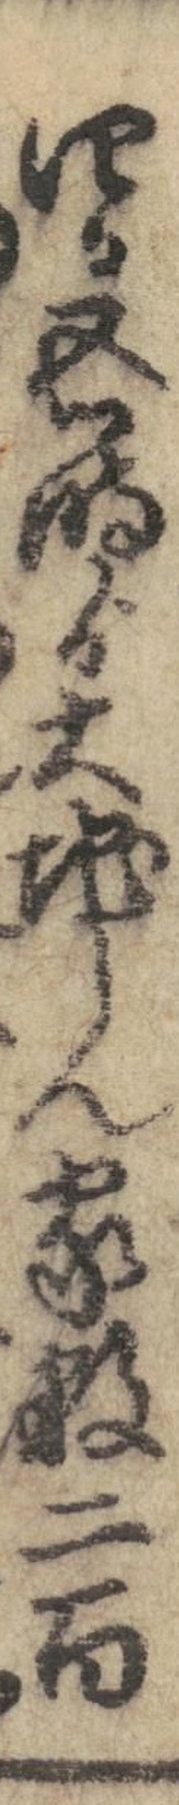四日五ツ時ゟ大地しん家数二百
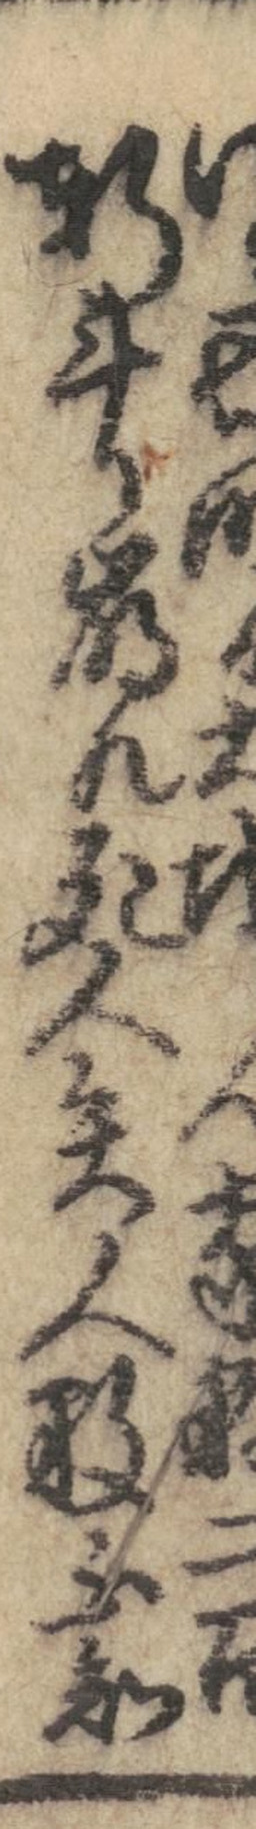軒計り崩れ死人失人数不知
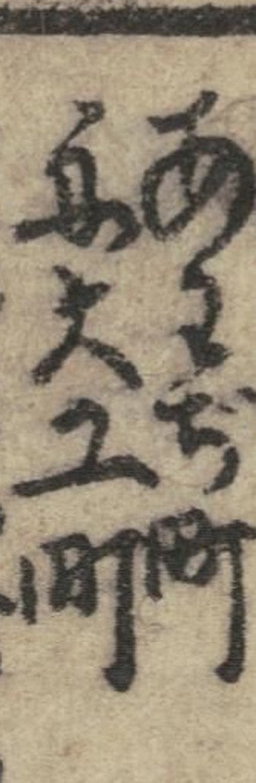舟大工町
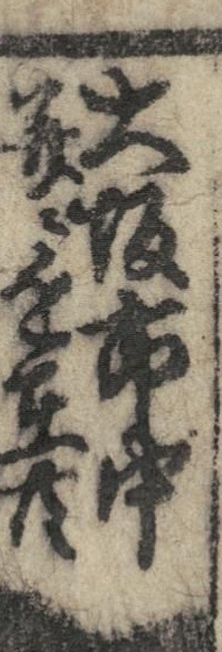大坂市中
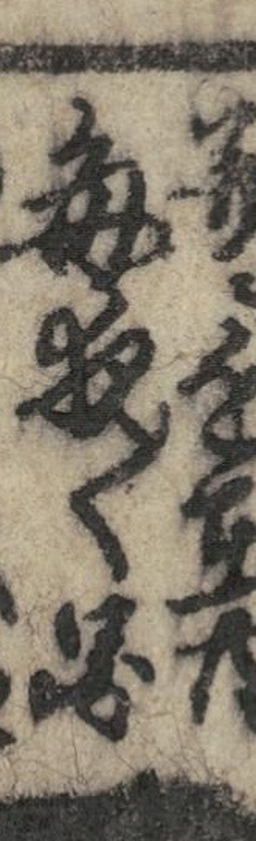毎夜〳〵図
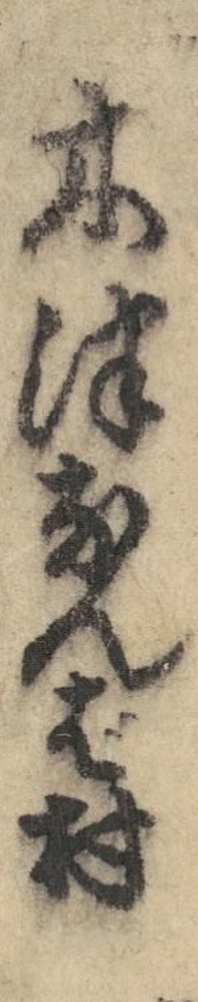木津なんば村
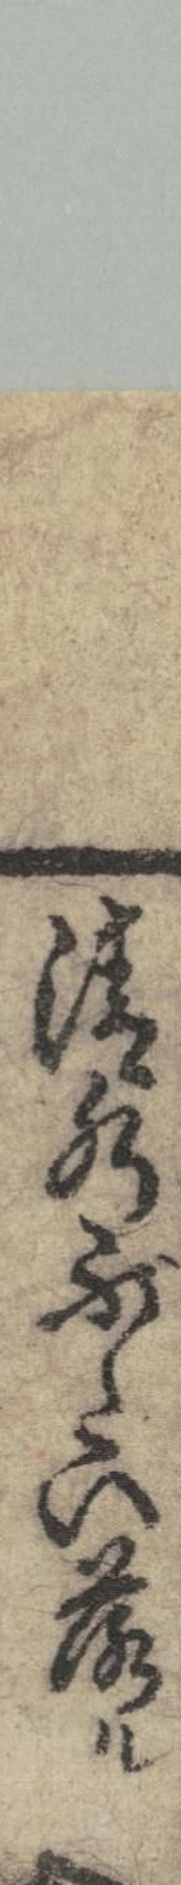清水ぶたい落ル
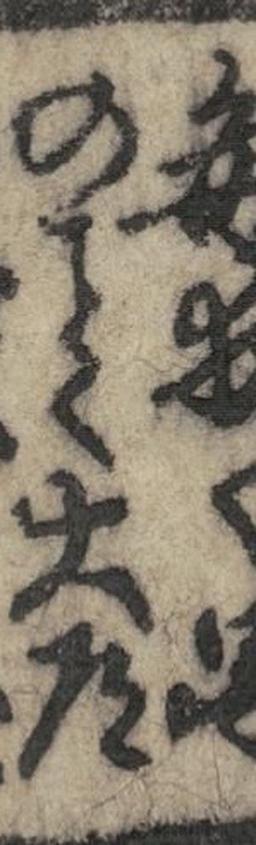のごとく大道
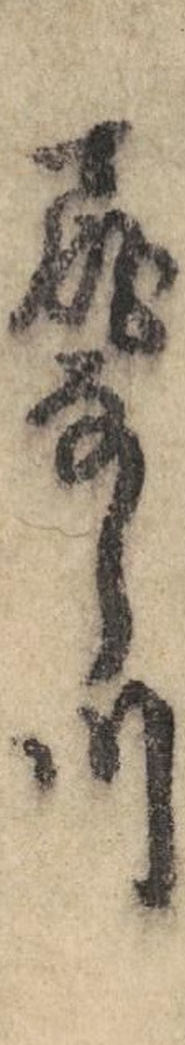尻なし川
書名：諸国大阪太地震大つなミ末代噺
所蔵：東京大学地震研究所図書室 Earthquake Research Institute Library, The University of Tokyo, JAPAN
